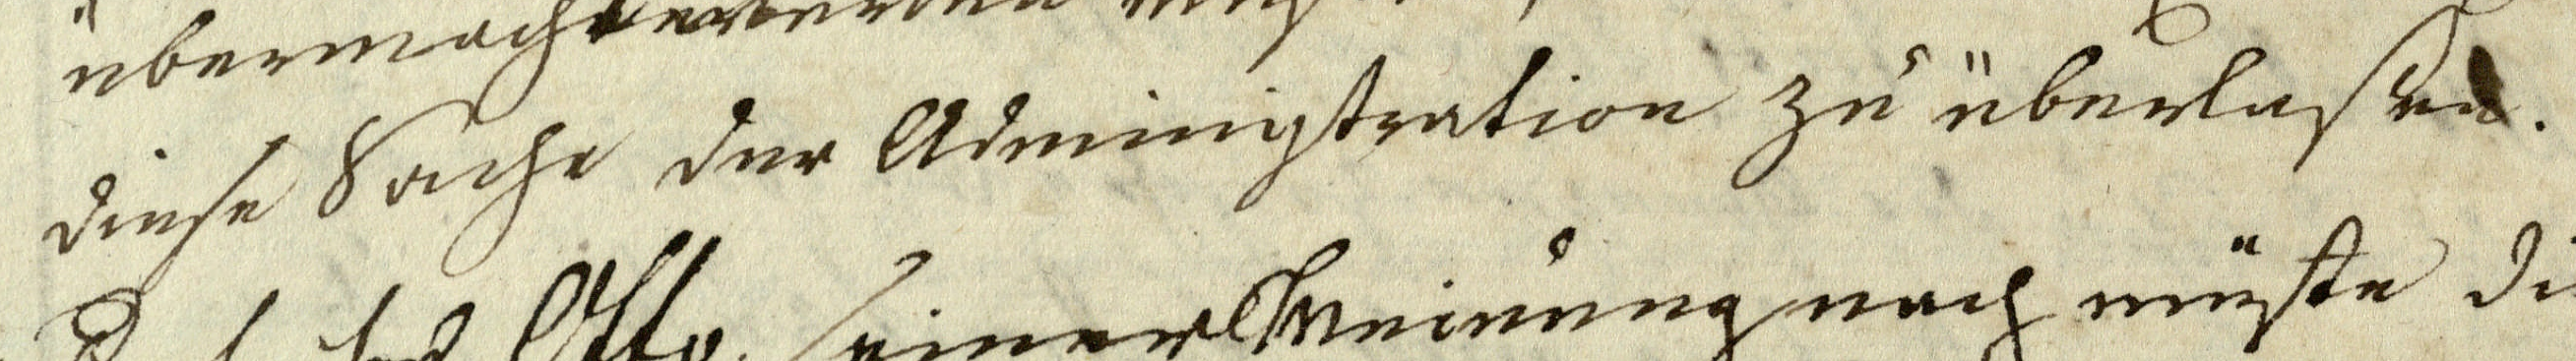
diese Sache der Administration zu überlassen.
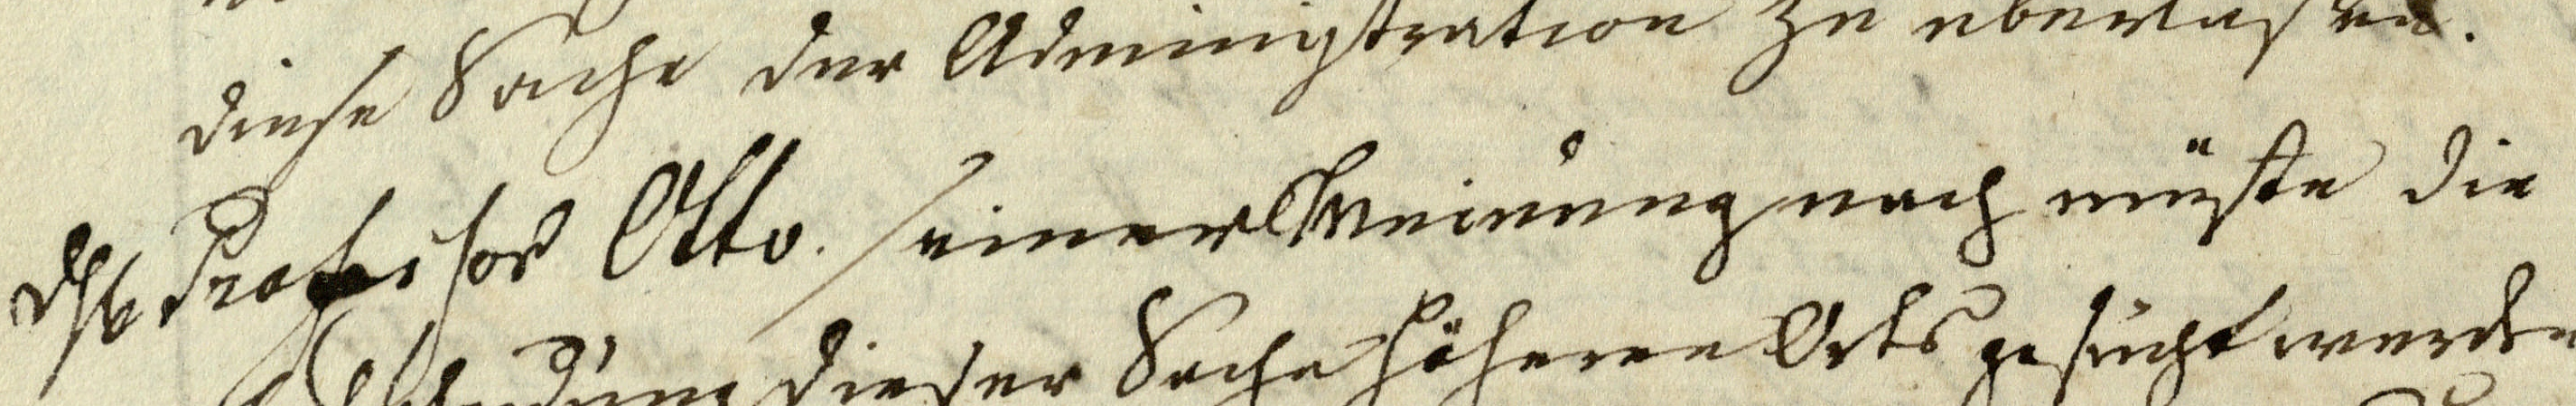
dh Professor Otto. seiner Meinung nach müste die
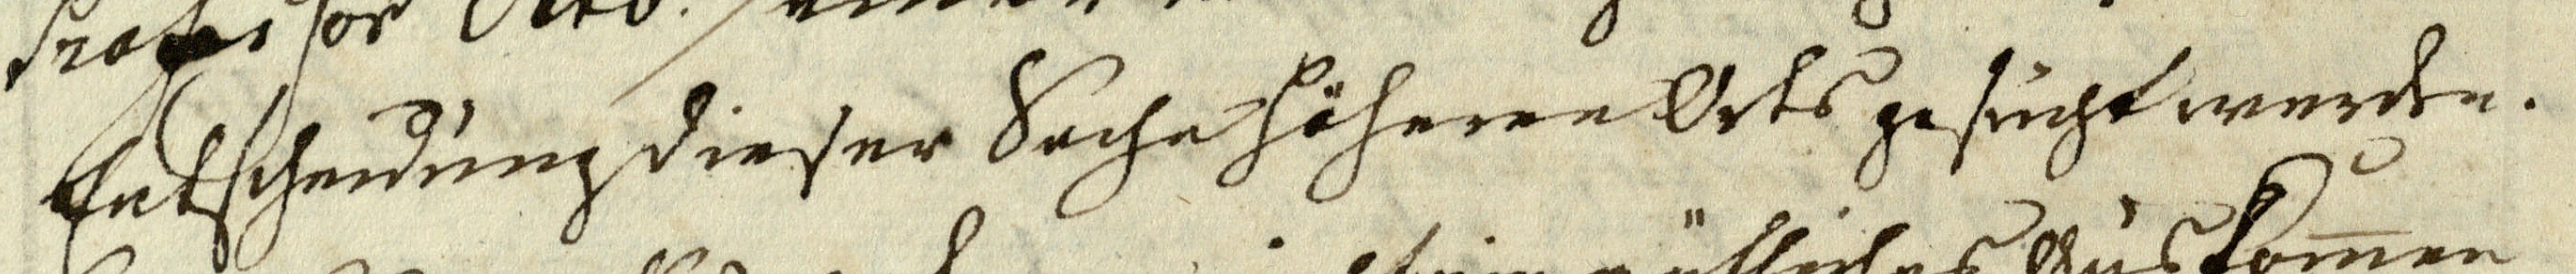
Entscheidung dieser Sache höheren Orts gesucht werden.
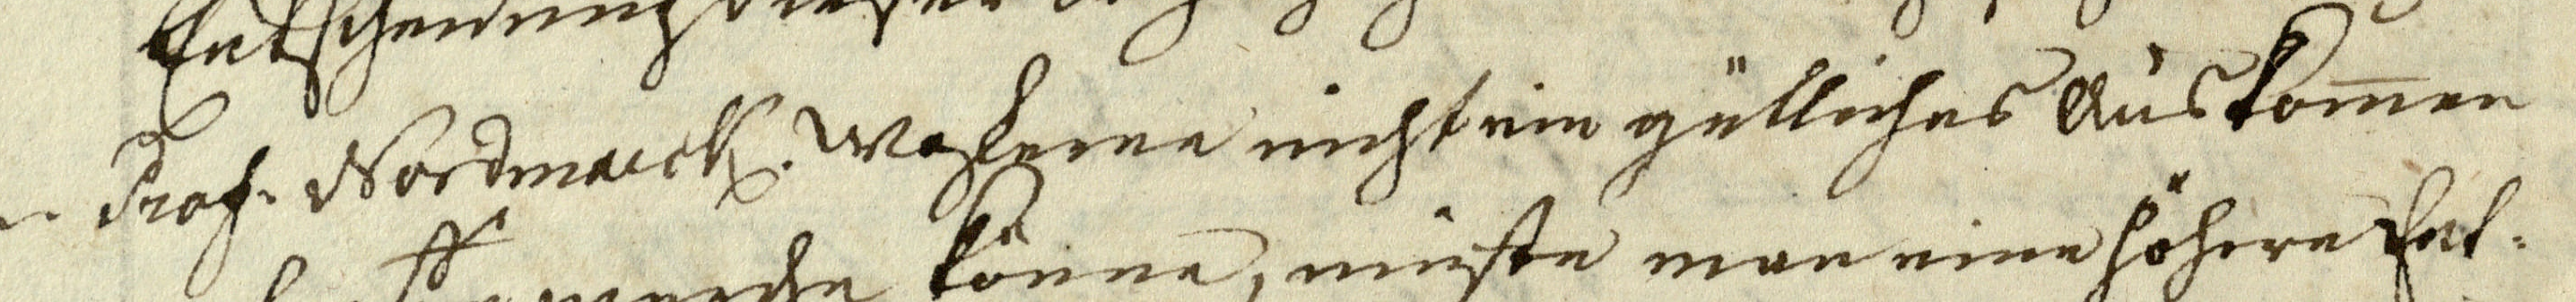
Prof. Nordmarck. Woferne nicht ein gütliches Auskomen
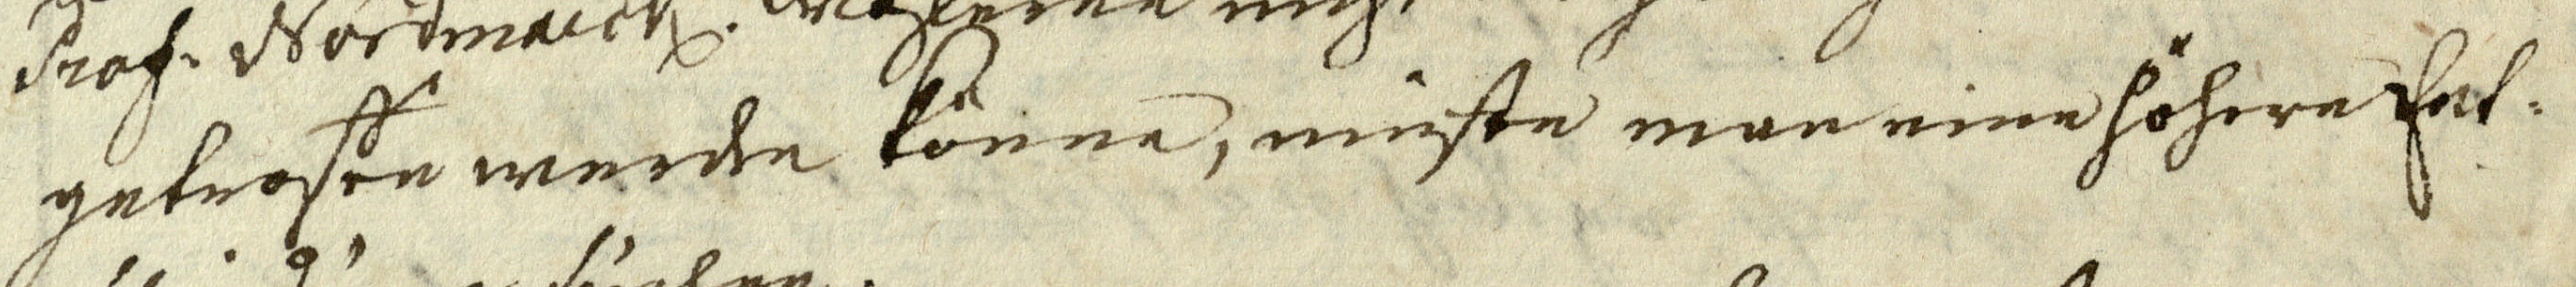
getroffen werden könne, müste man eine höhere Ent¬
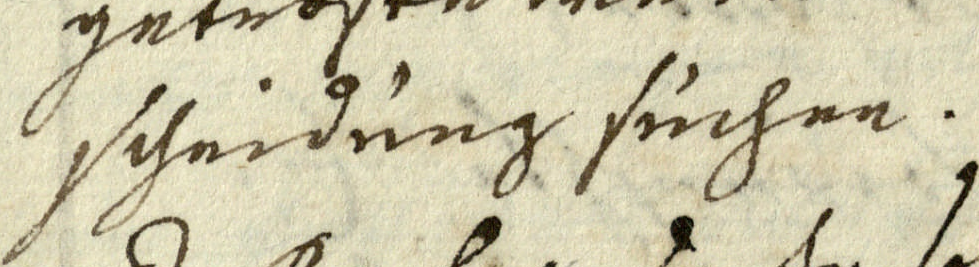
scheidung suchen.
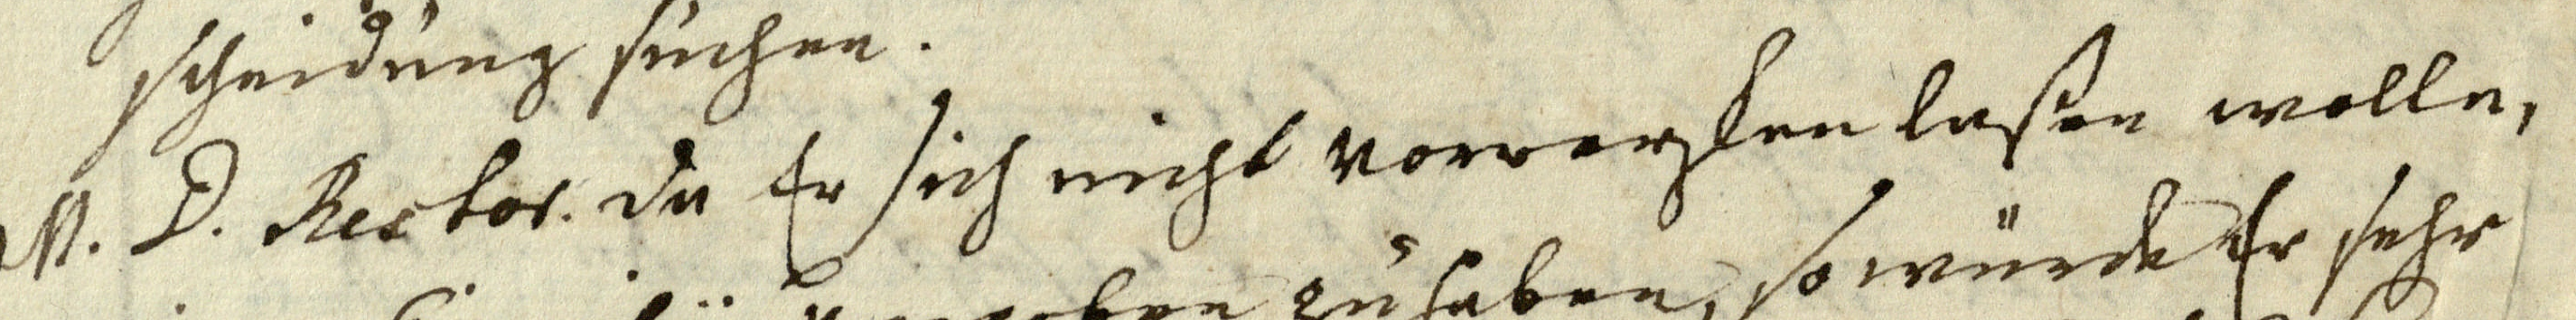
M. D. Rector. da Er sich nicht vorwerfen laßen wolle,
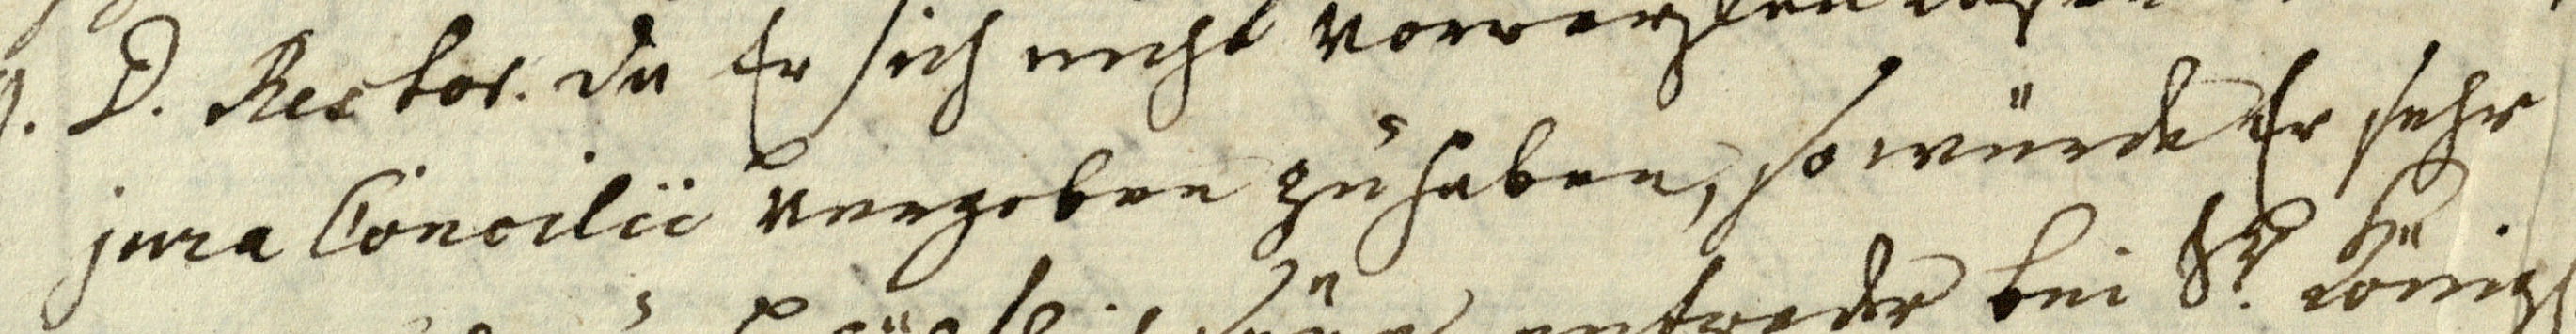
jura Concilii vergeben zu haben, so würde Er sehr
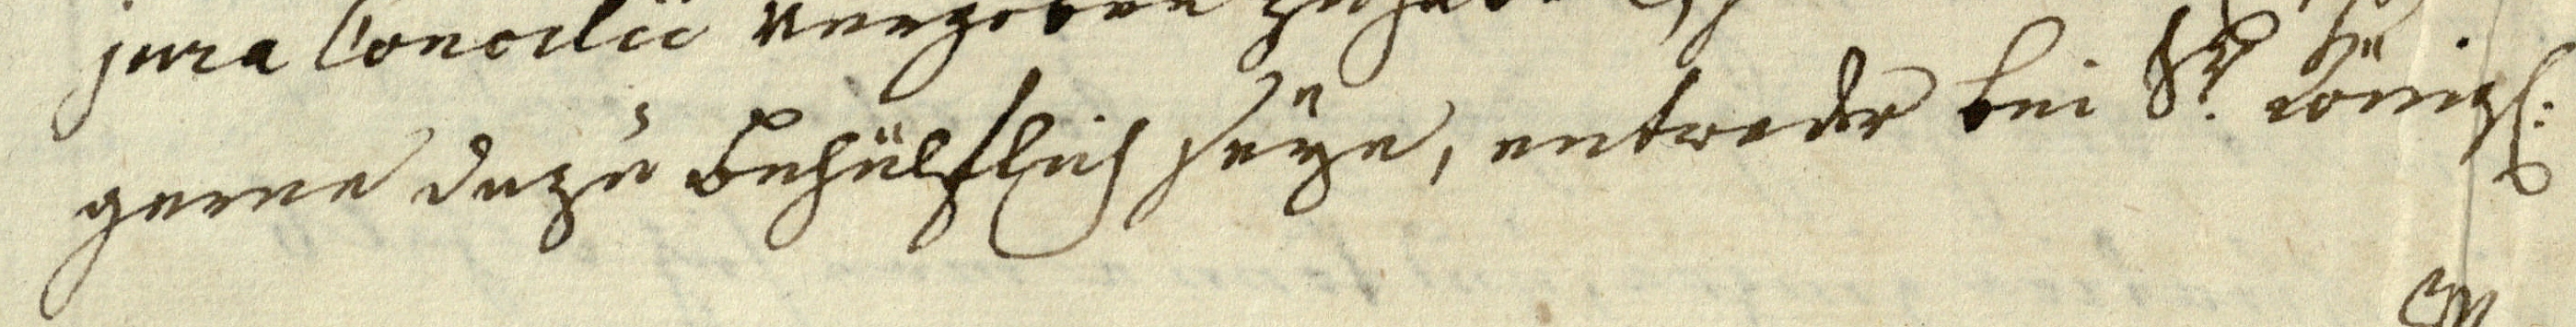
gerne dazu Behülflich seyn, entweder bei Sr. Königl:
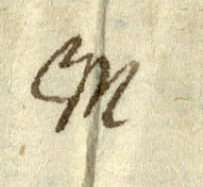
M
